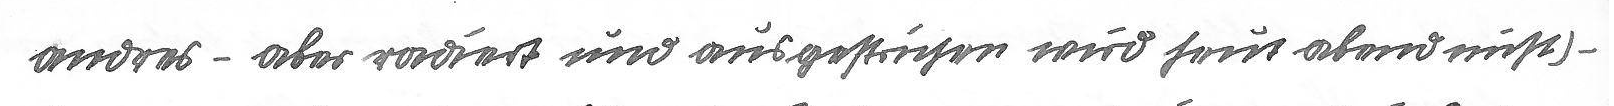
anderes – aber radiert und ausgestrichen wird heut abend nicht) –
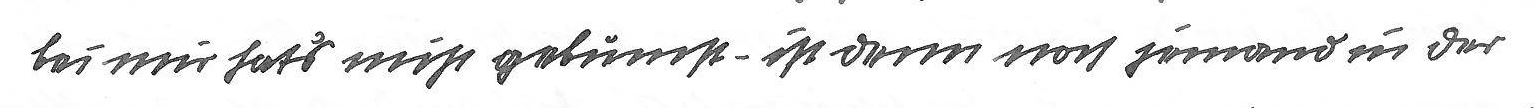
bei mir hat’s nicht gebumst – ist denn noch jemand in der
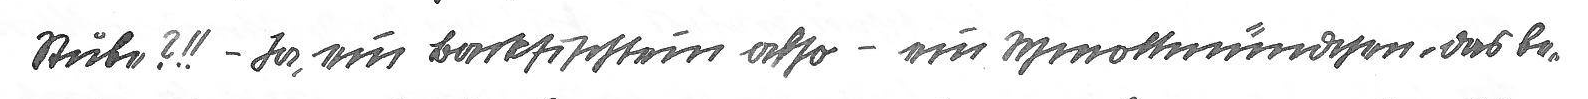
Stube?!! – Ja, ein Backfischlein also – ein Schmollmündchen, das be¬
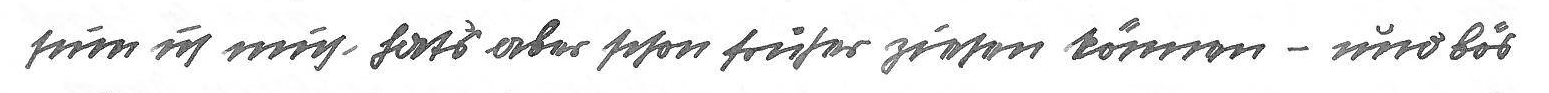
sinn ich mich, hat’s aber schon früher ziehen können – und bös
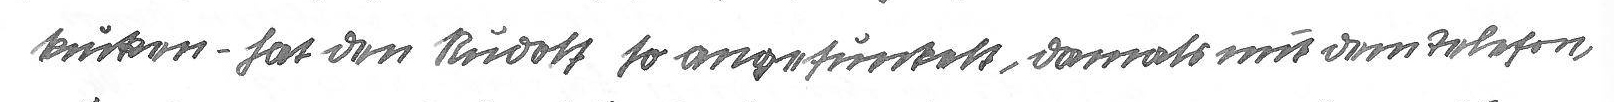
kucken – hat den so angefunkelt, damals mit dem Telefon,
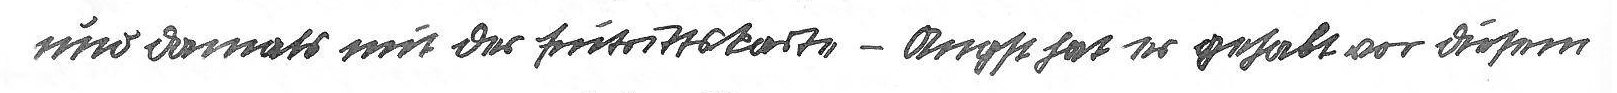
und damals mit der Eintrittskarte – Angst hat er gehabt vor diesem
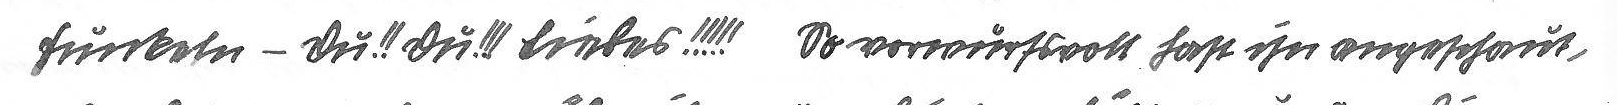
Funkeln – Du!! Du!!! Liebes!!!!! So vorwurfsvoll hast ihn angeschaut,
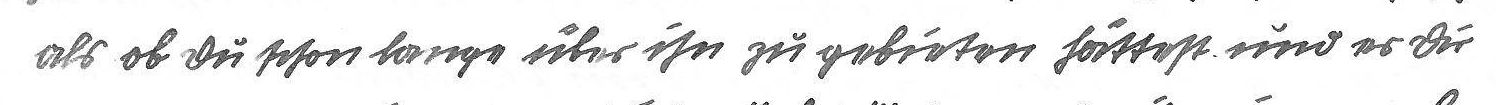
als ob Du schon lange über ihn zu gebieten hättest und er Dir
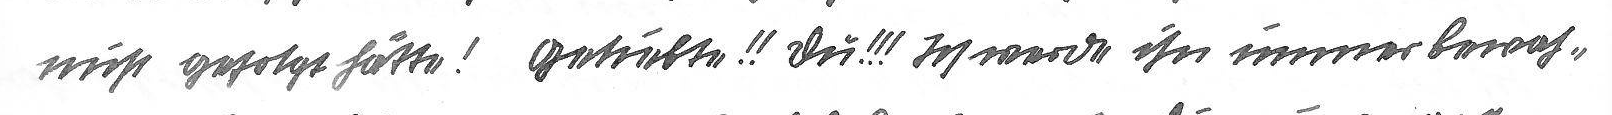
nicht gefolgt hätte! Geliebte!! Du!!! Ich werd ihn immer bewah¬
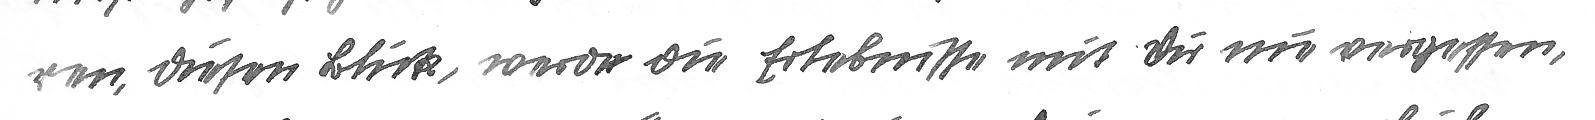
ren, diesen Blick, werde die Erlebnisse mit Dir nie vergessen,
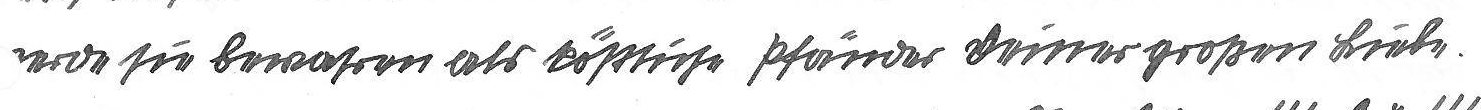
erde sie bewahren als köstliche Pfänder Deiner großen Liebe.
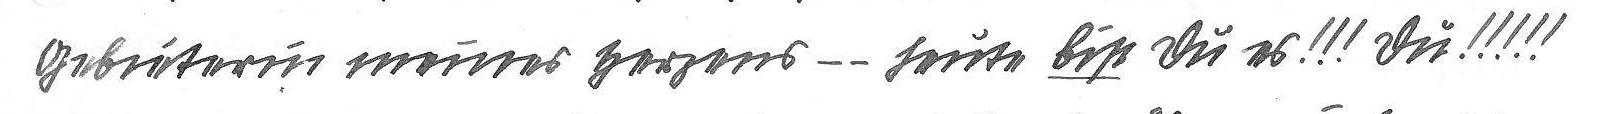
Gebieterin meines Herzens – – heute bist Du es!! Du!!!!!
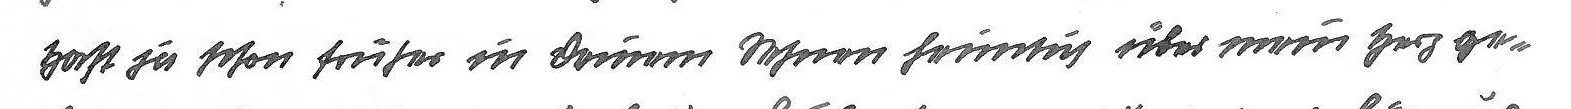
Hast ja schon früher in Deinem Sehnen heimlich über mein Herz ge¬
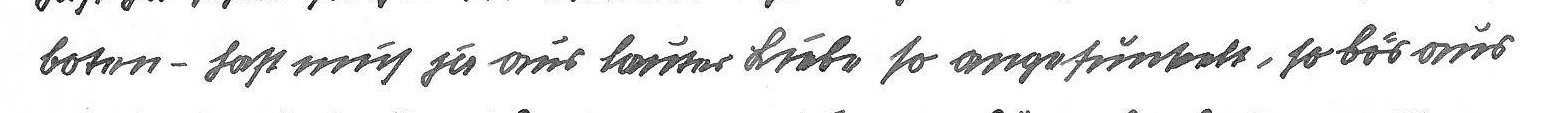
boten – hast mich ja aus lauter Liebe so angefunkelt, so bös aus
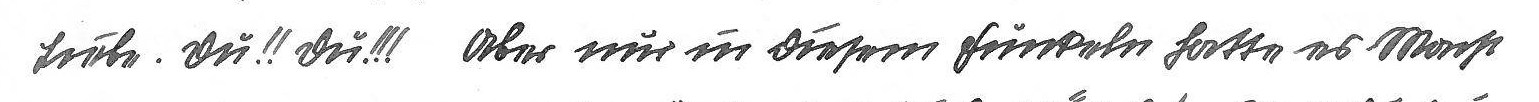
Liebe. Du!! Du!!! Aber nur in diesem Funkeln hatte es Macht
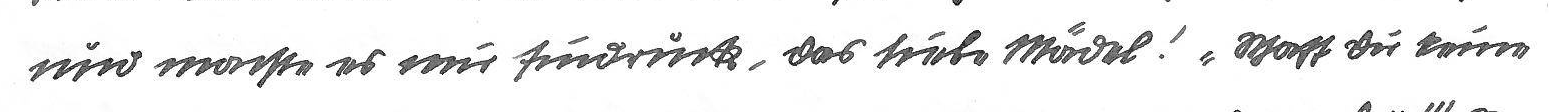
und machte es mir Eindruck, das liebe Mädel! “Schaff Dir keine
